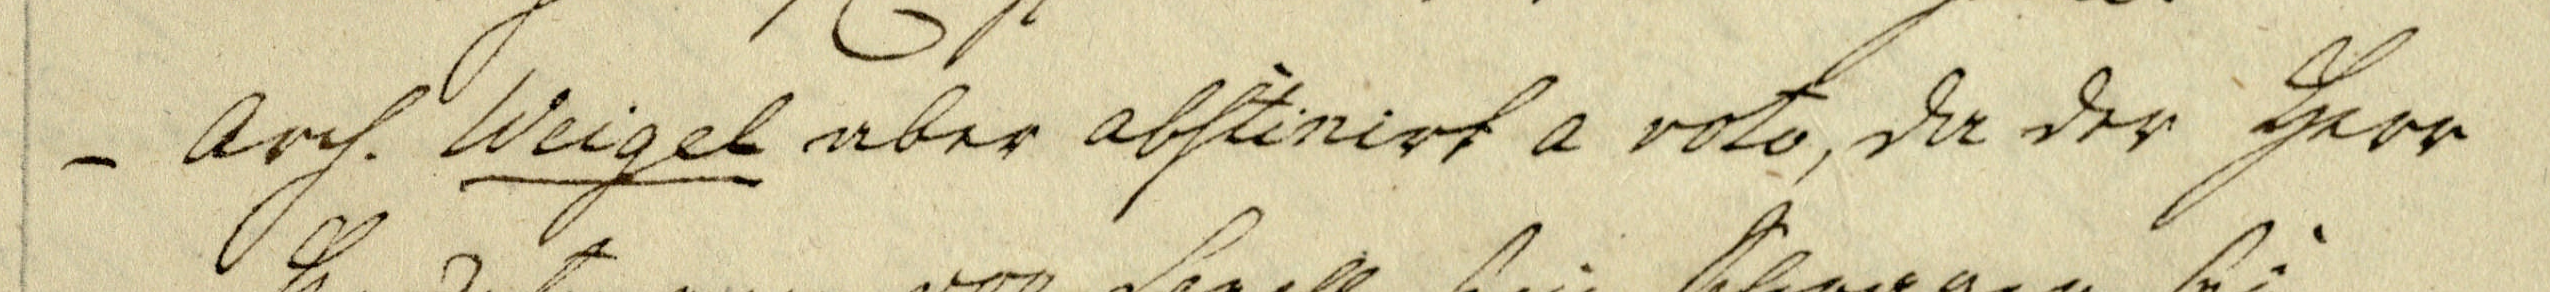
Arch. Weigel aber abstinirt a voto, da der Herr
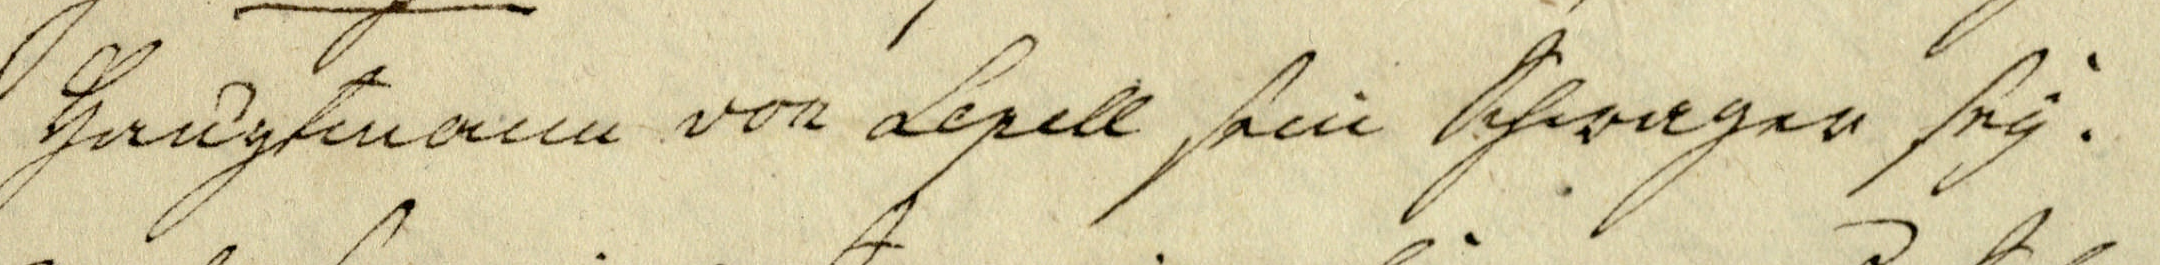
Hauptmann von Lepell sein Schwager seÿ.
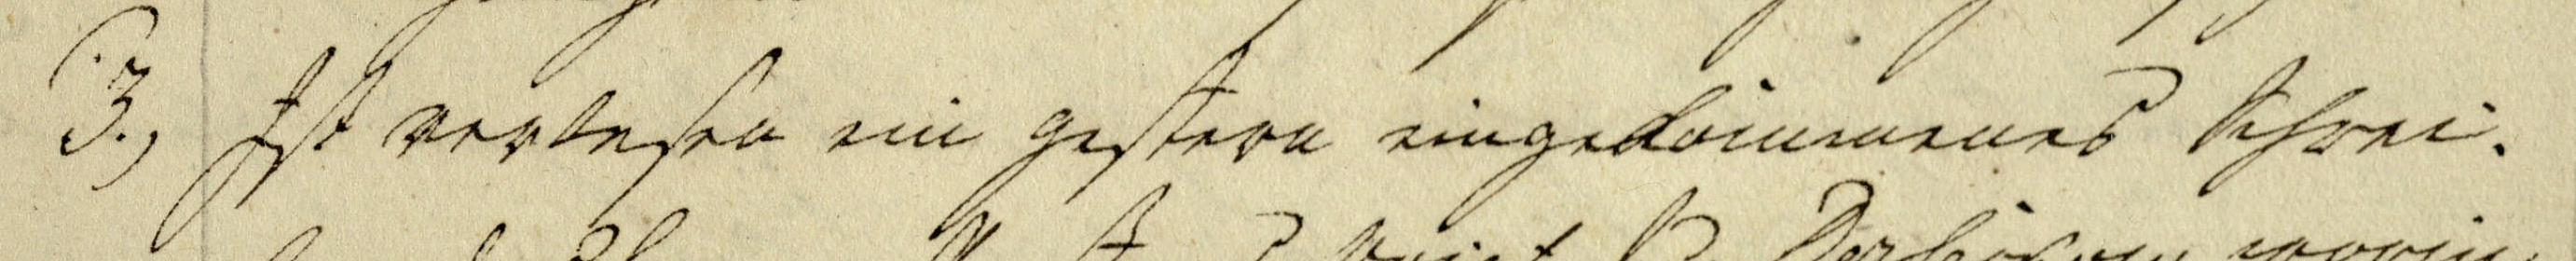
3., Ist verlesen ein gestern eingekommenes Schrei¬
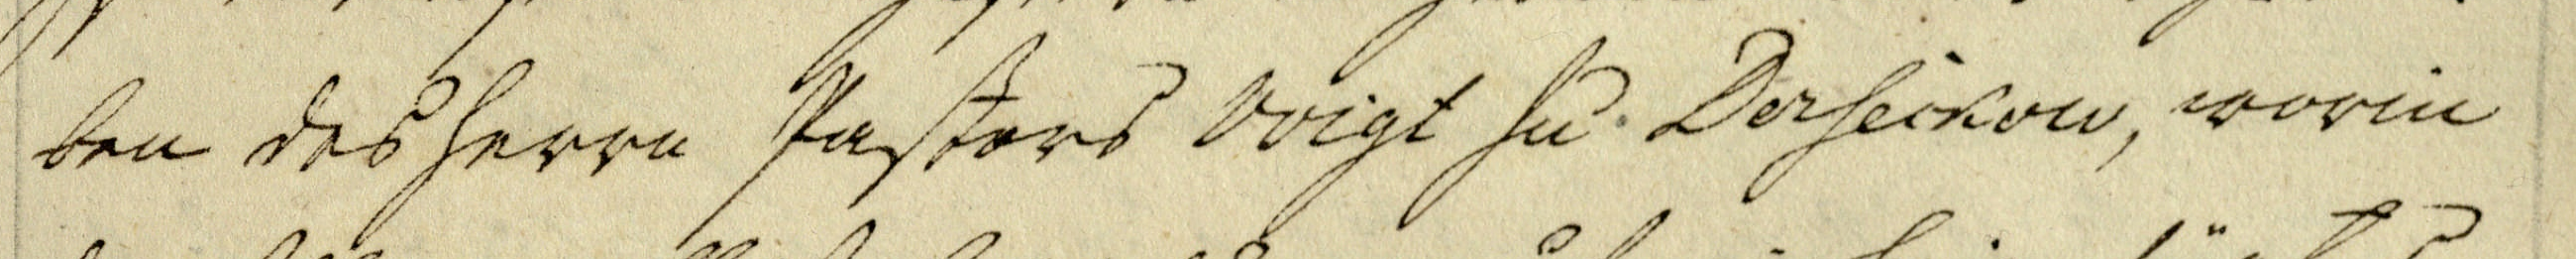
ben des Herrn Pastors Voigt zu Derseckow, worin
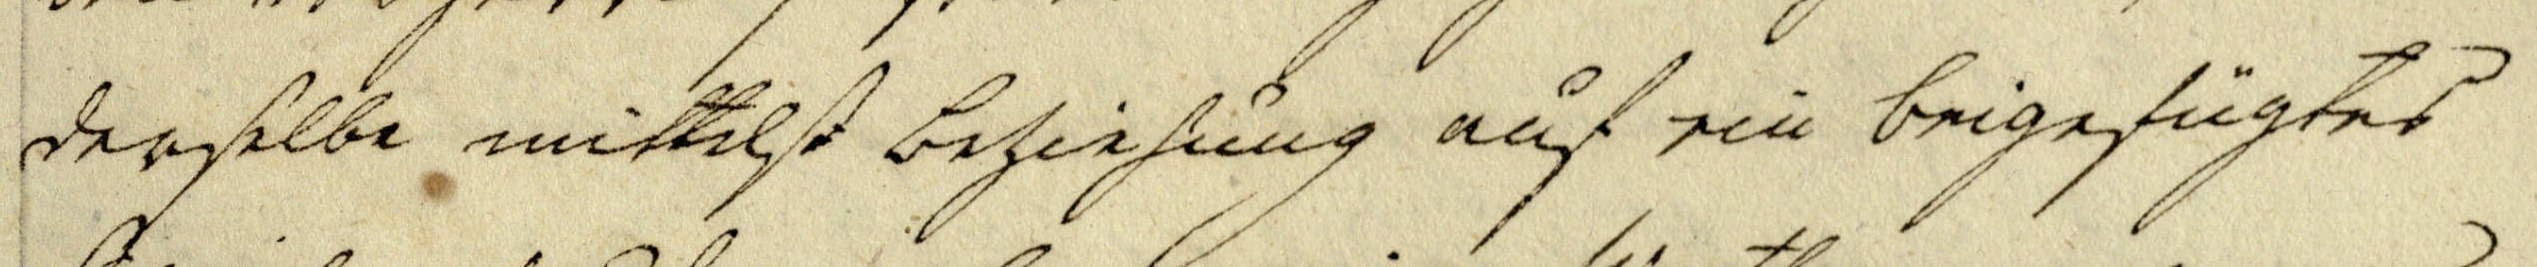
derselbe mittelst Beziehung auf ein beigefügtes
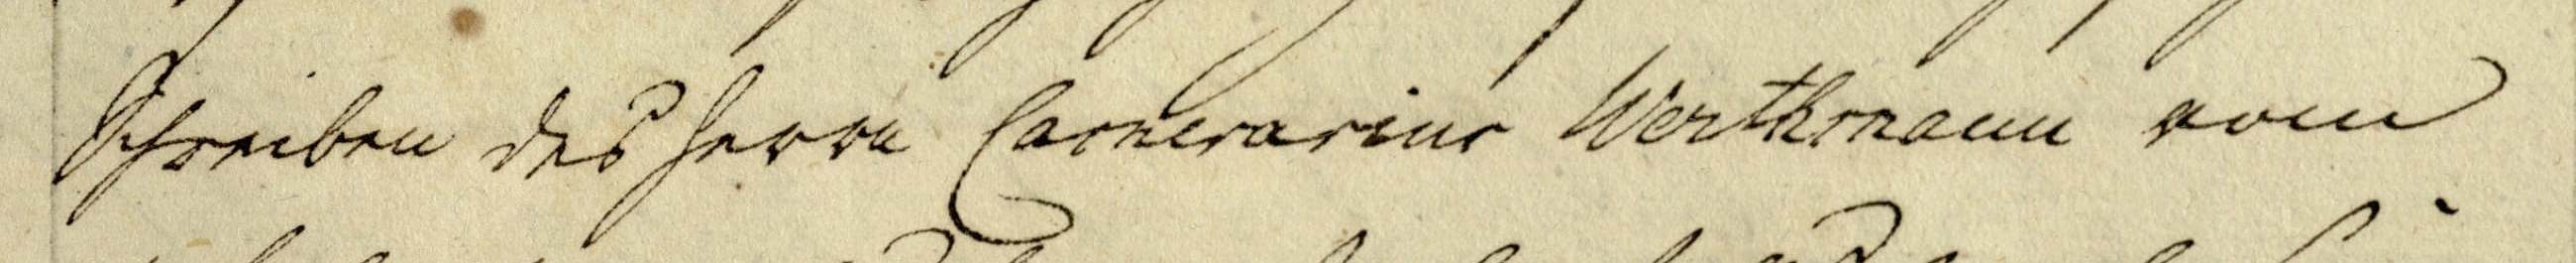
Schreiben des Herrn Camerarius Werthmann vom
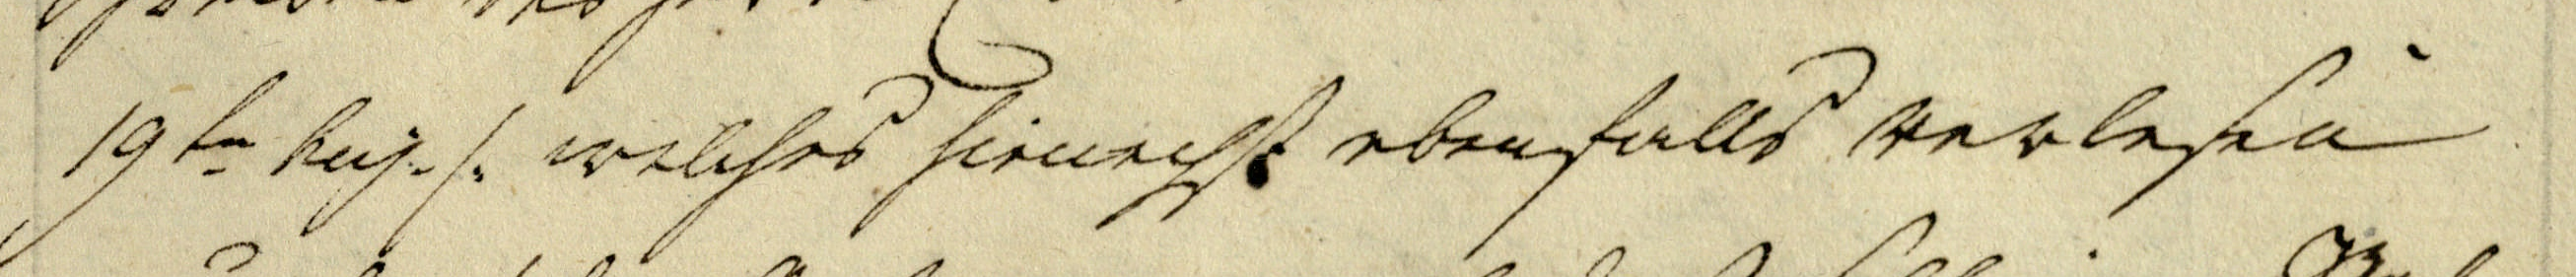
19 t. huj. /. welches hienechst ebenfalls verlesen
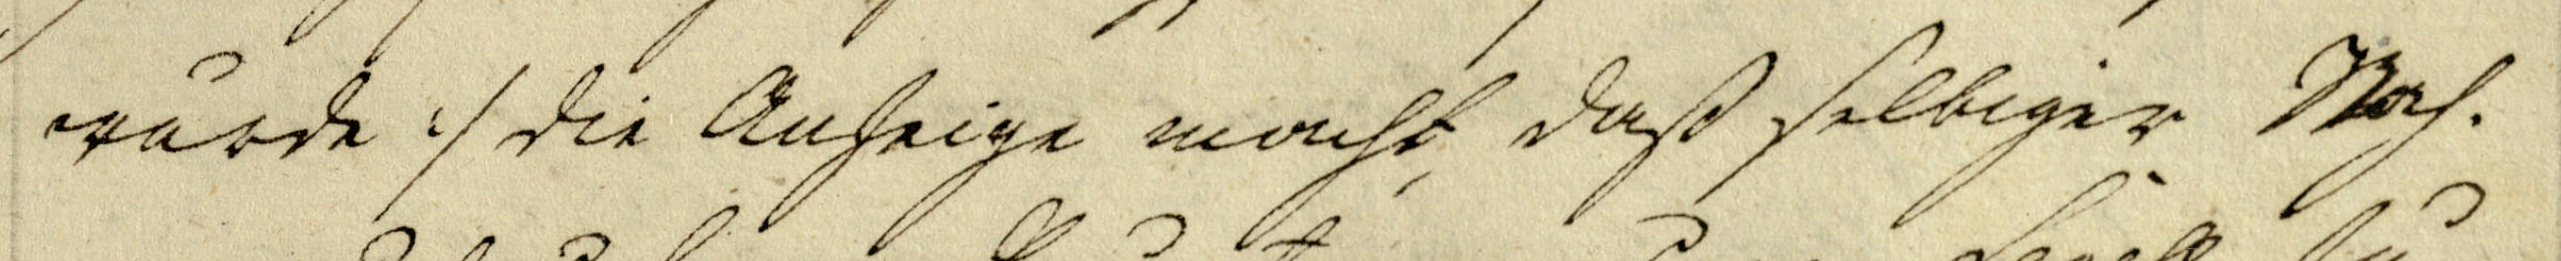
wurde :/ die Anzeige macht, daß selbiger Nah¬
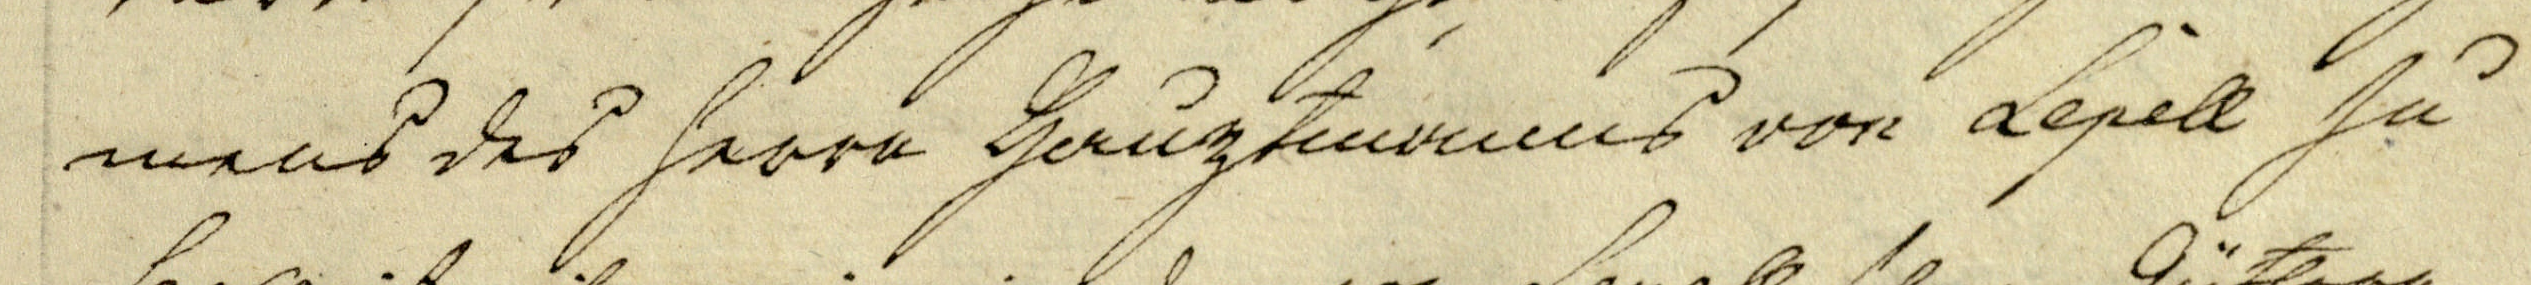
mens des Herrn Hauptmanns von Lepell zu
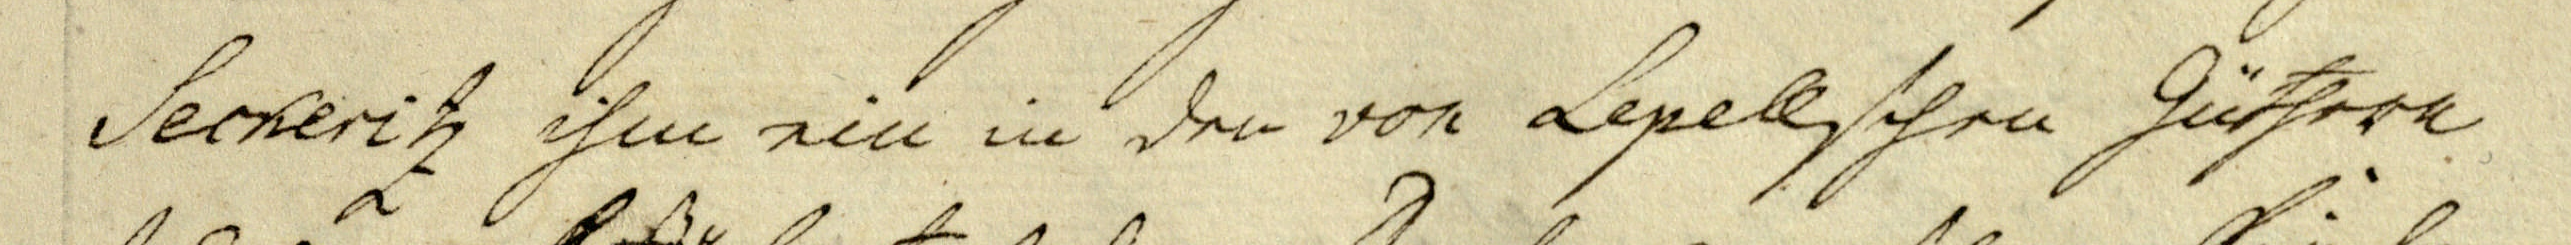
Seckeritz ihm ein in den von Lepellschen Güthern
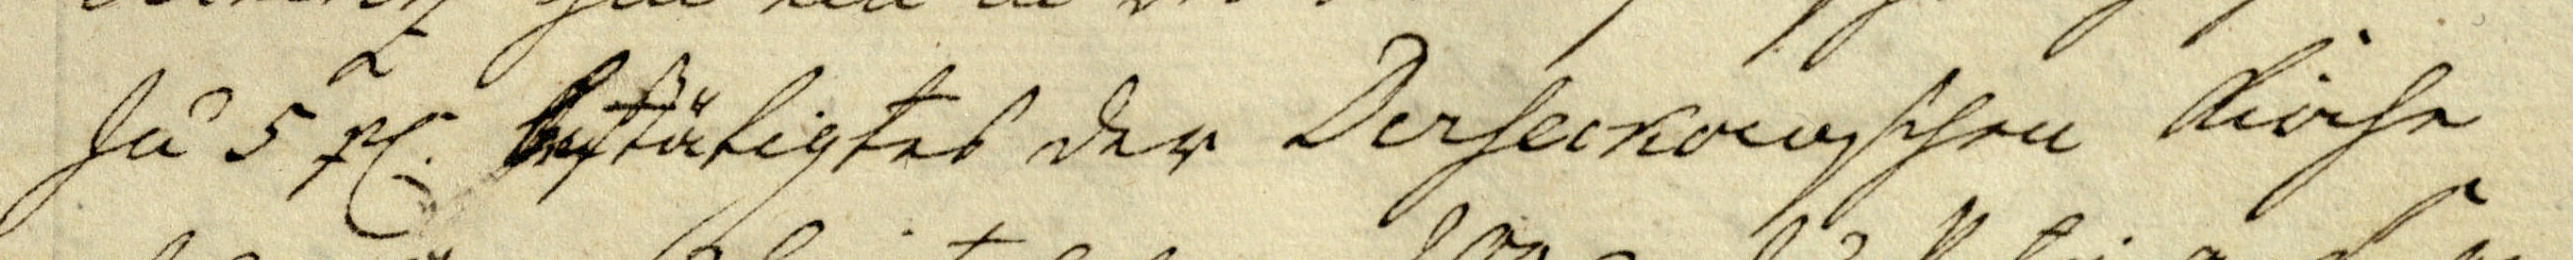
zu 5 pl. bestätigtes der Derseckowschen Kirche
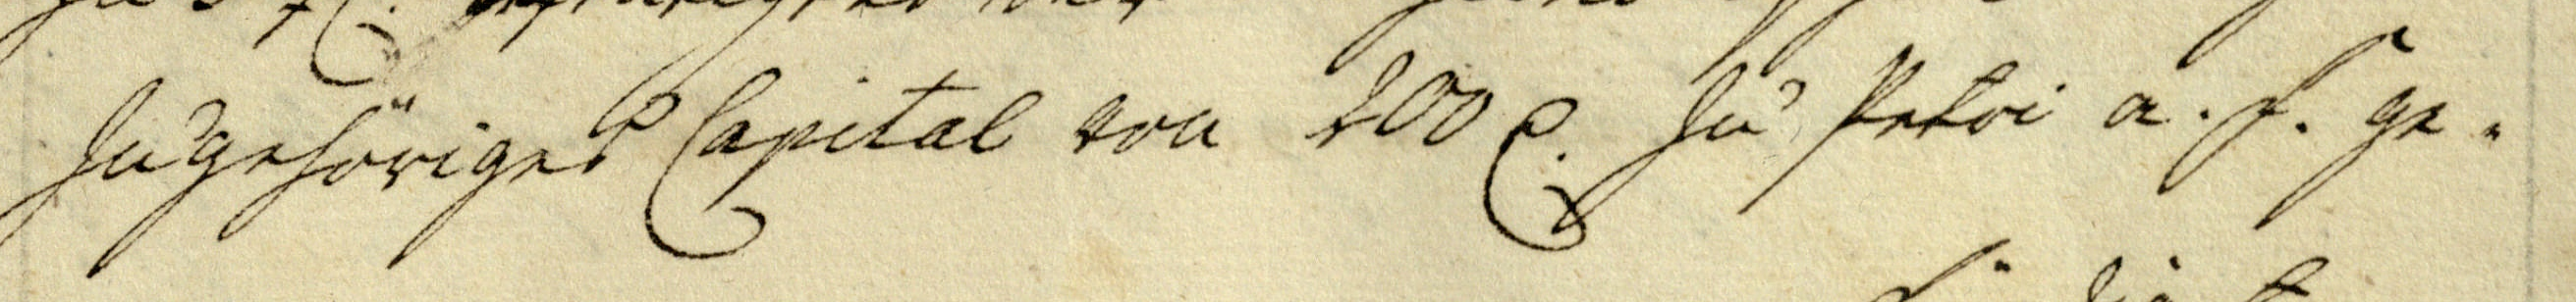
zugehöriges Capital von 200 l. zu Petri a . F. ge¬
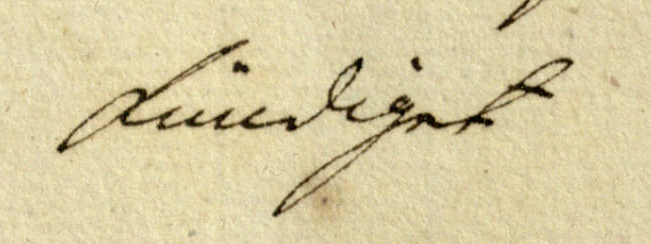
kündiget
